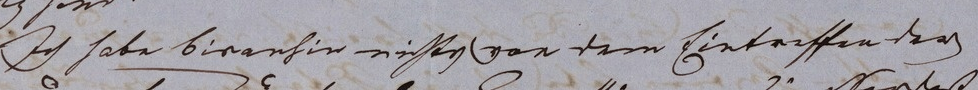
Ich habe bis anhin nichts von dem Eintreffen der
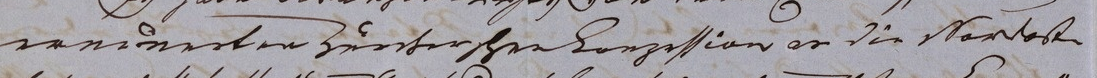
erneuerten Zürcherschen Conzession an die Nordost-
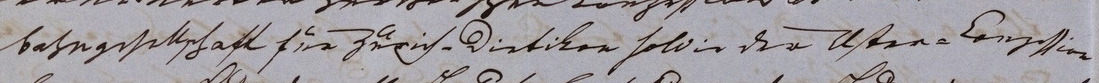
bahngesellschaft für Zürich–Dietikon sowie der Uster-Conzession
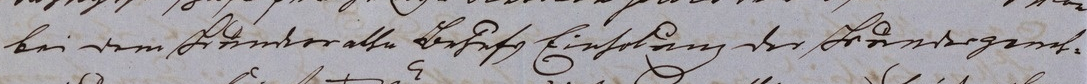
bei dem Bundesrathe Behufs Einholung der Bundesgeneh-
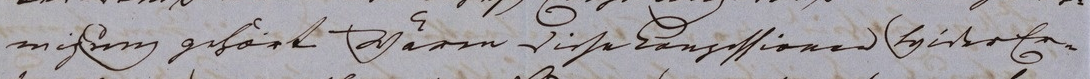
migung gehört. Wären diese Conzessionen wider Er-
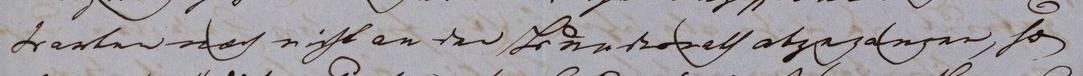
warten noch nicht an den Bundesrath abgegangen, so
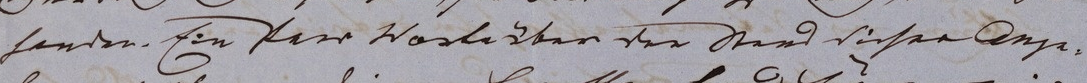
senden. Ein Paar Worte über den Stand dieser Ange-
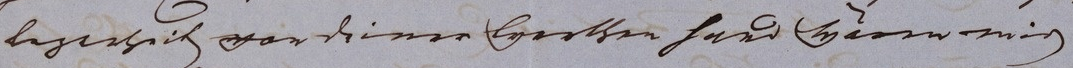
legenheit von Deiner werthen Hand wären mir
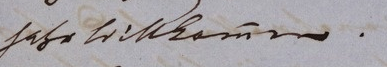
sehr willkommen.
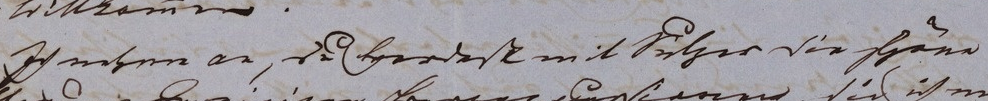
Ich nehme an, Du werdest mit Sulzer die schöne
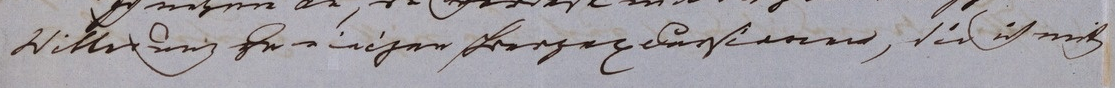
Witterung zu einigen Bergexcursionen, die ich mit
